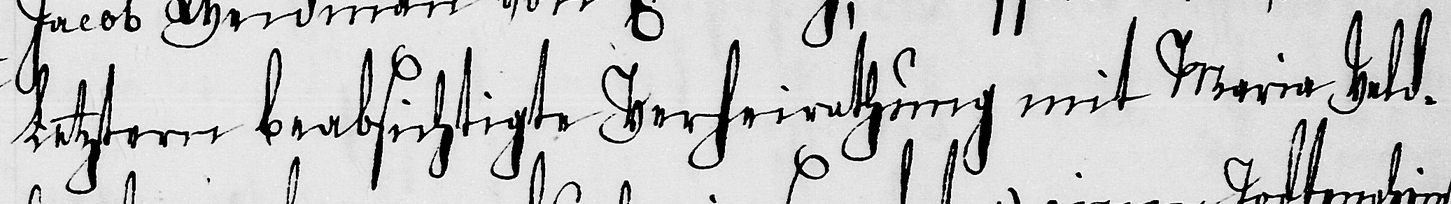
Letztern beabsichtigte Verheirathung mit Maria Veld¬
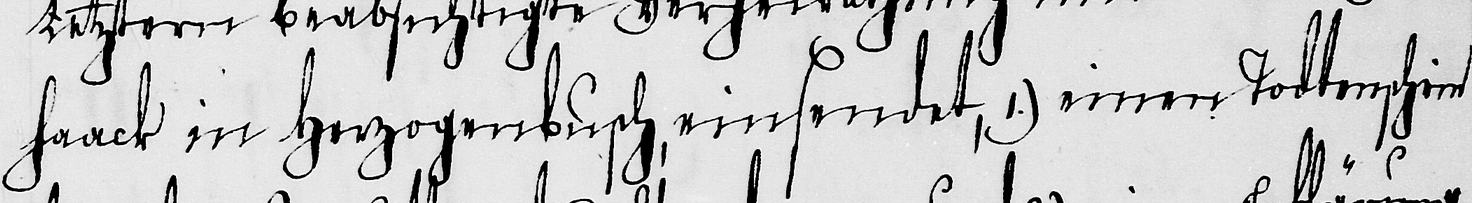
haack in Herzogenbusch, einsendet, 1.) einen Todtenschein
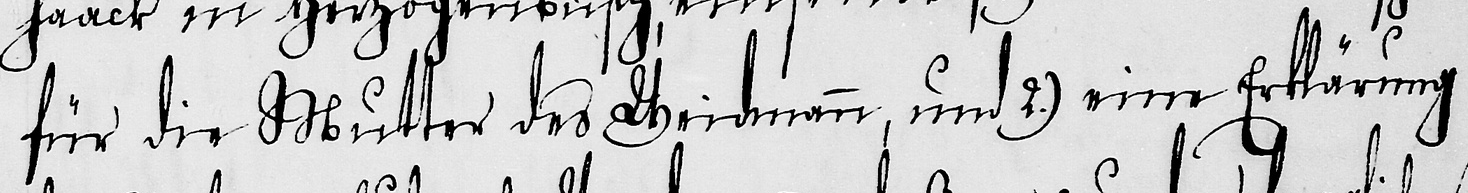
für die Mutter des Weidmann, und 2.) eine Erklärung
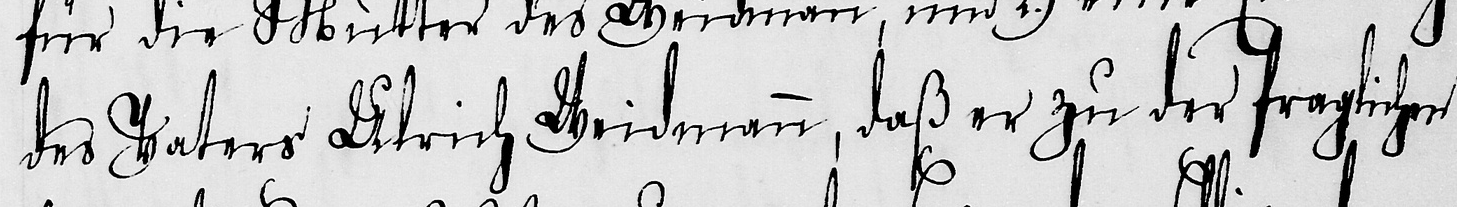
des Vaters Ulrich Weidmann, daß er zu der fraglich¬
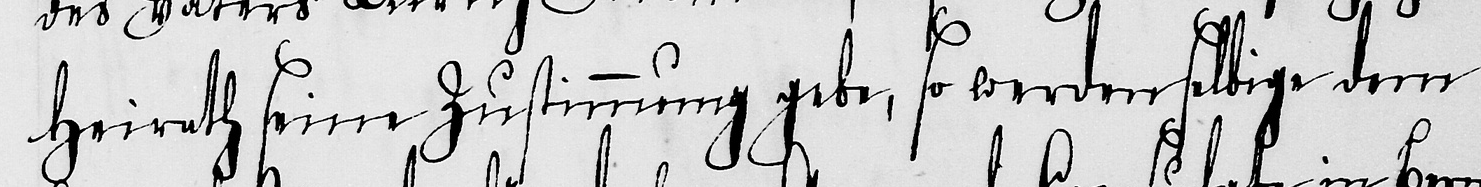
Heirath seine Zustimmung gebe, so werden selbige dem
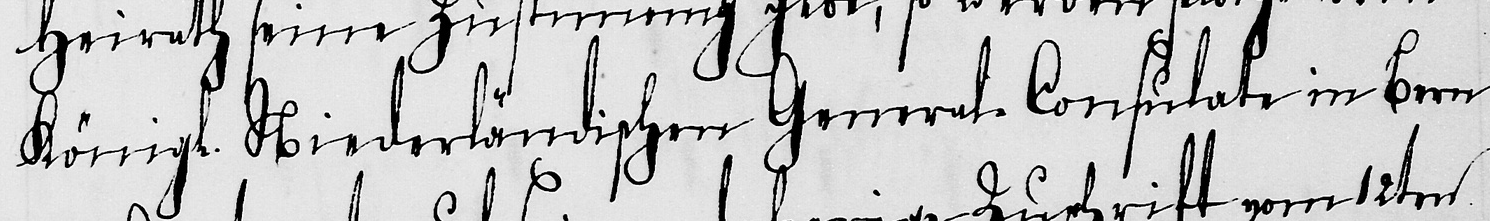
Königl. Niederländischen General-Consulate in Bern
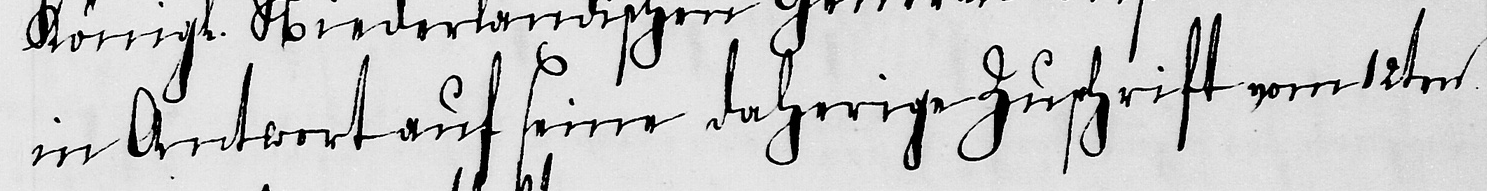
in Antwort auf seine daherige Zuschrift vom 12ten
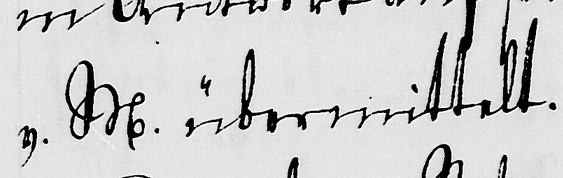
v. M. übermittelt.
